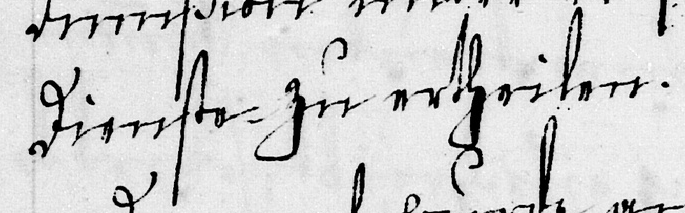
Dienste zu ertheilen.
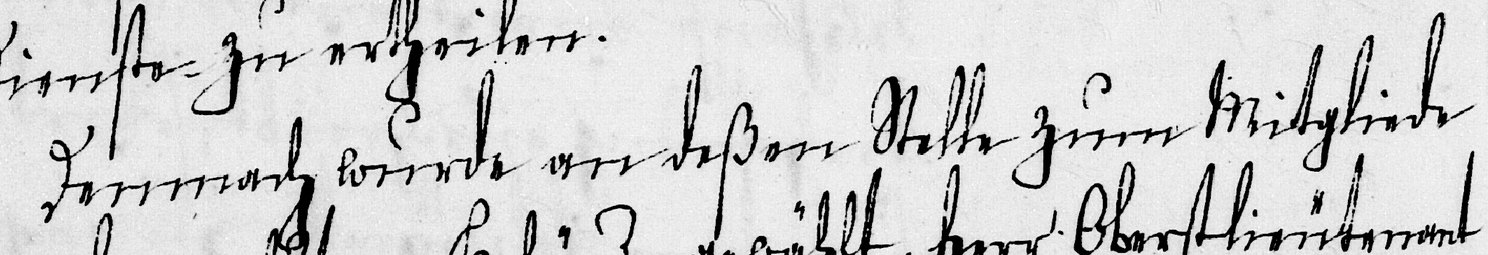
Demnach wurde an deßen Stelle zum Mitgliede
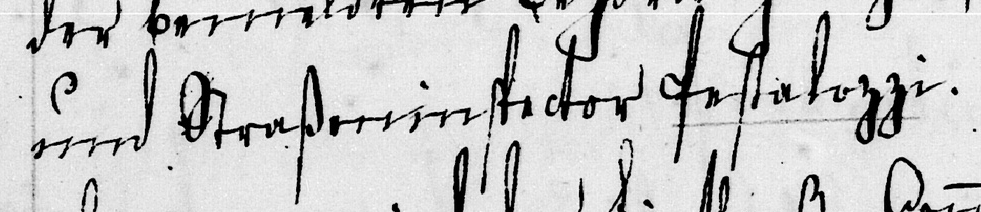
und Straßeninspector Pestalozzi.
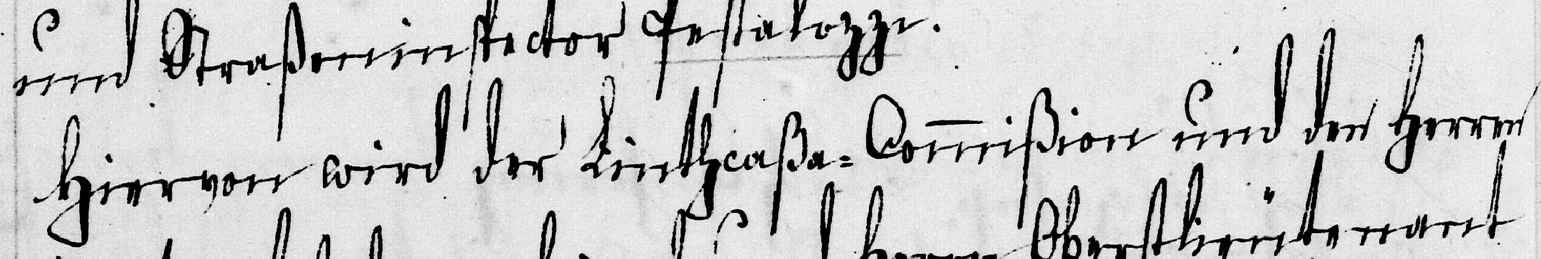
Hiervon wird der Linthcaßa-Commißion und den Herren
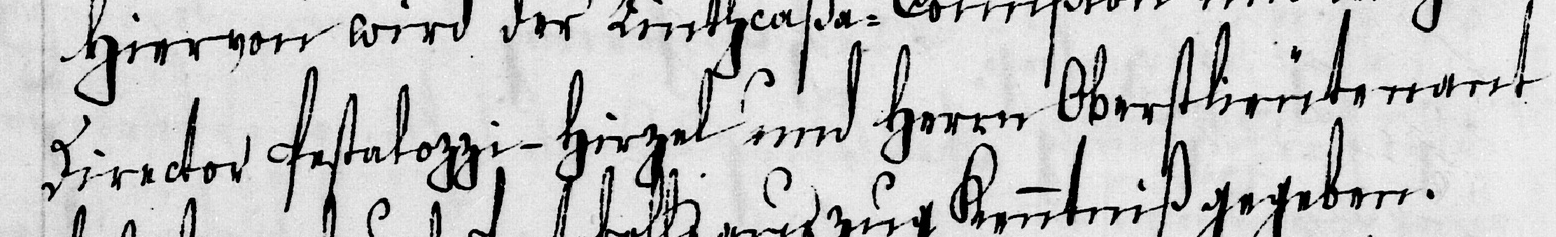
Director Pestalozzi-Hirzel und Herrn Oberstlieutenant
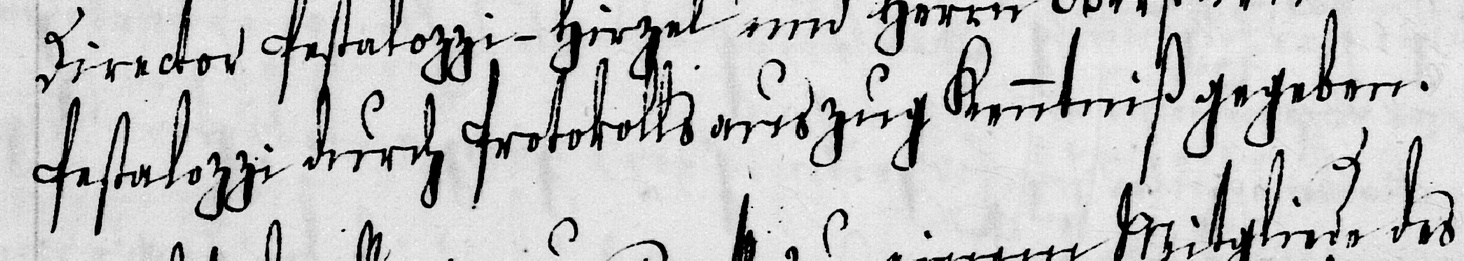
Pestalozzi durch Protokollsauszug Kenntniß gegeben.
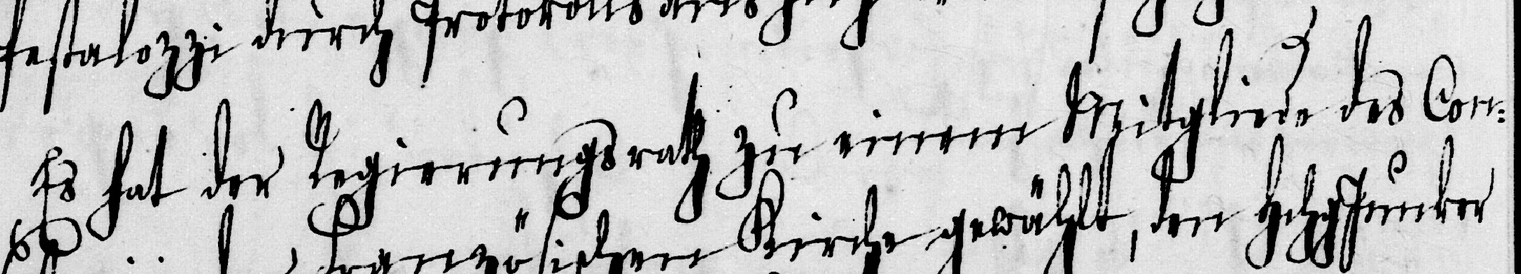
Es hat der Regierungsrath zu einem Mitgliede des Con¬
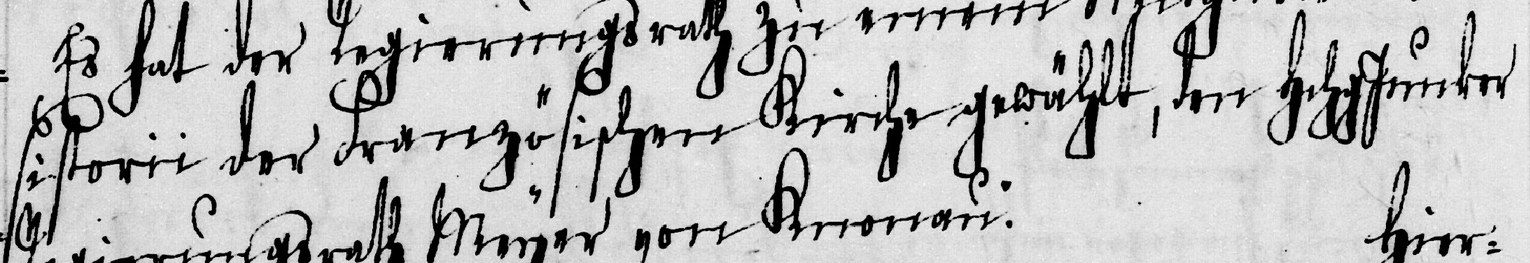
sistorii der Französischen Kirche gewählt, den Hchg. Junker
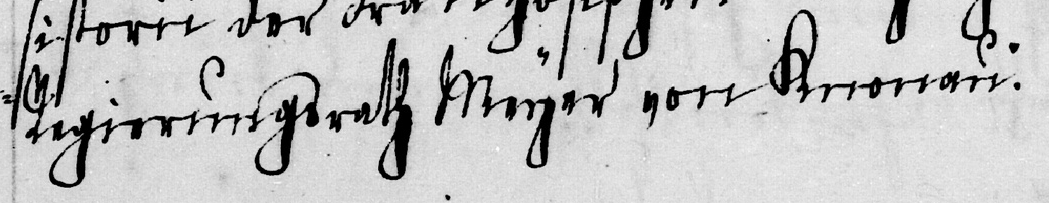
Regierungsrath Meyer von Knonau.
